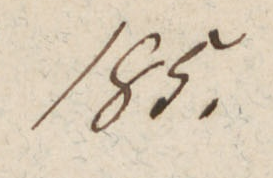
185.
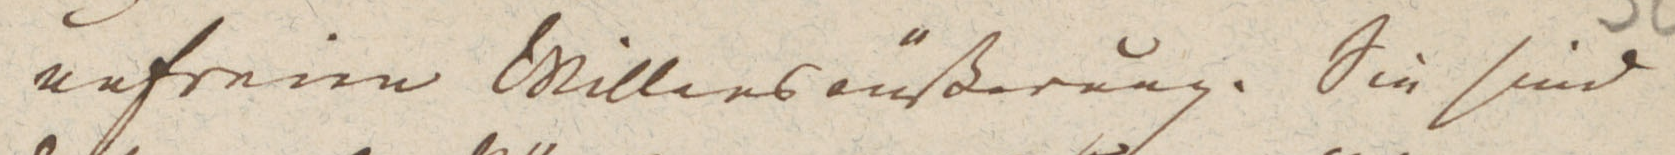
unfreien Willensäusserung. Sie sind
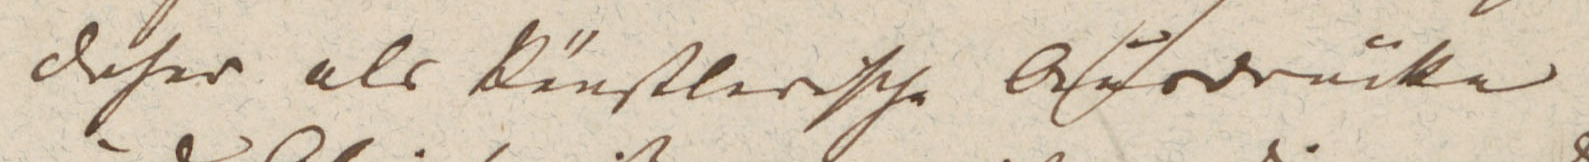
daher als künstlerische Ausdrücke
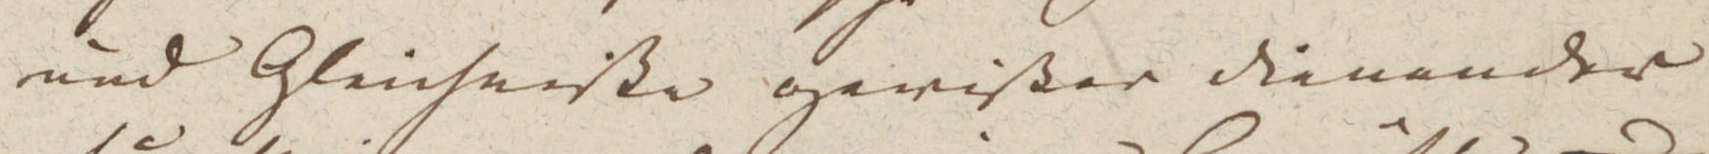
und Gleichnisse gewisser dienender
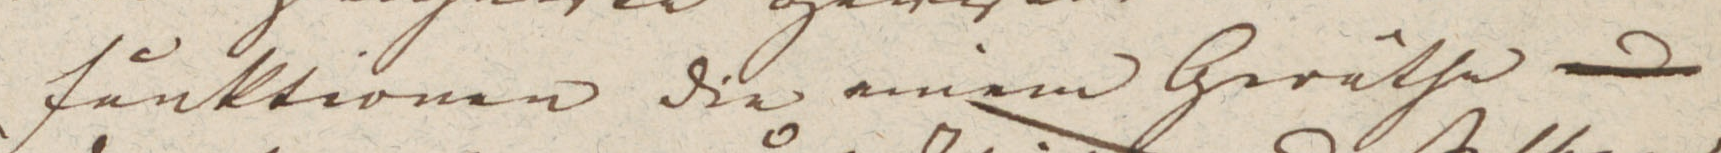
Funktionen die einem Geräthe und
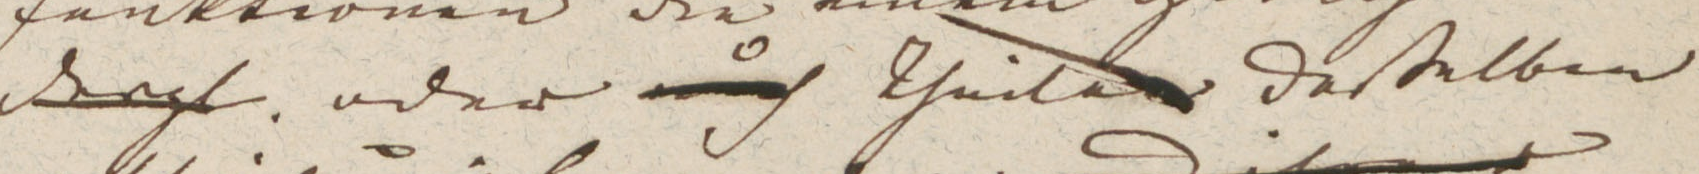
Dergl. oder auch Theilen desselben
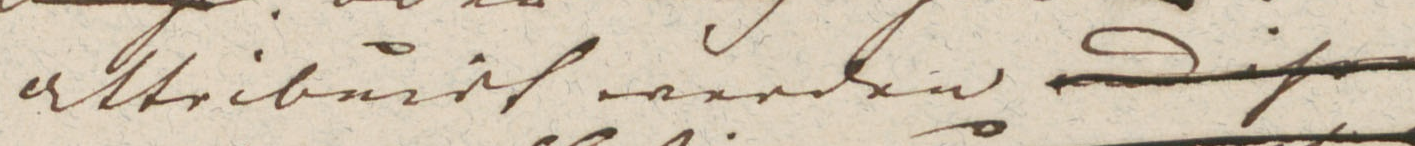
attribuirt werden und ihrer
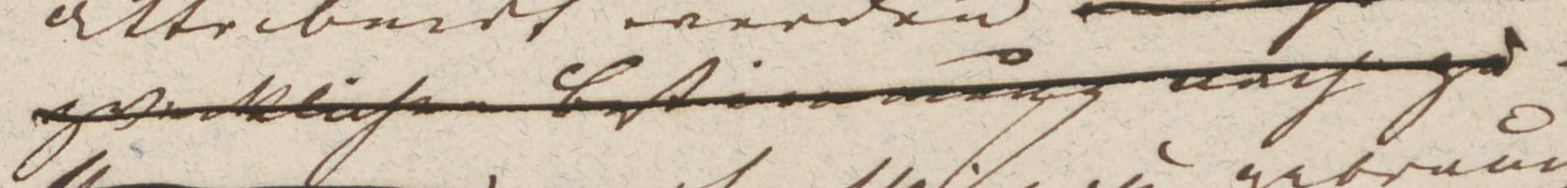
zwecklichen Bestimmung nach zu-
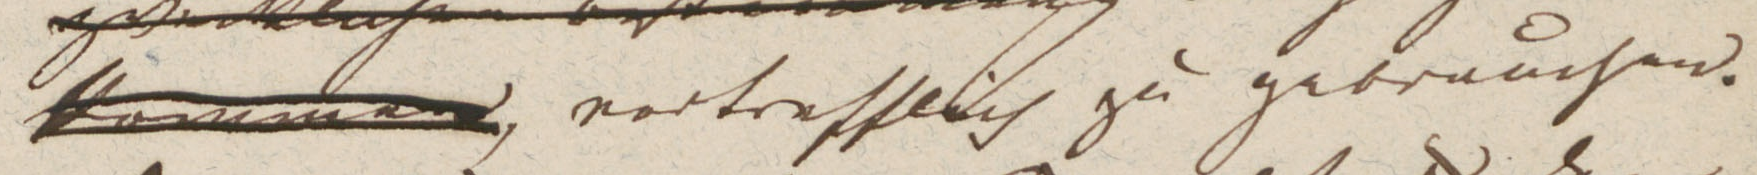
kommen, vortrefflich zu gebrauchen.
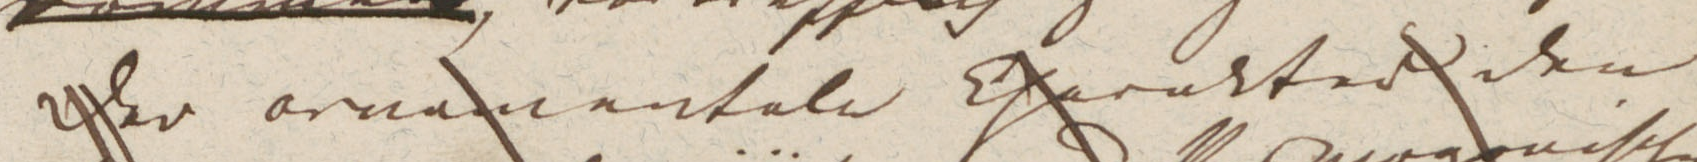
Der ornamentale Charakter den
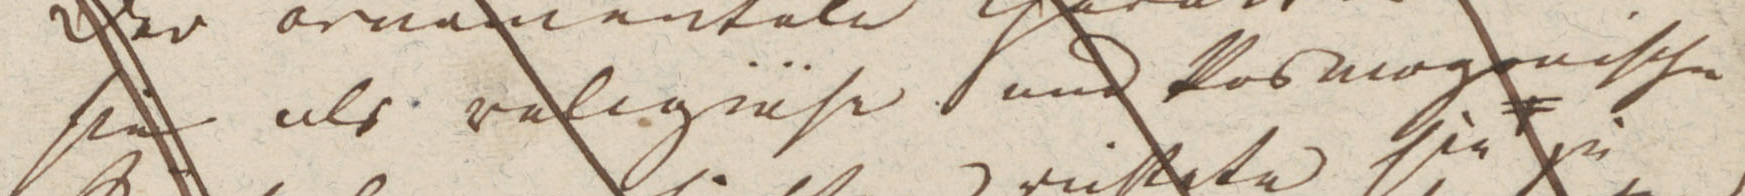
sie als religiöse und kosmogonische
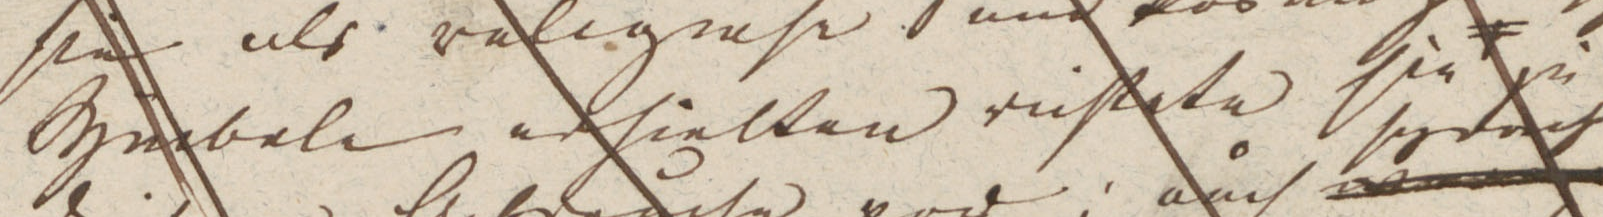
Symbole erhielten richtete sie % zu
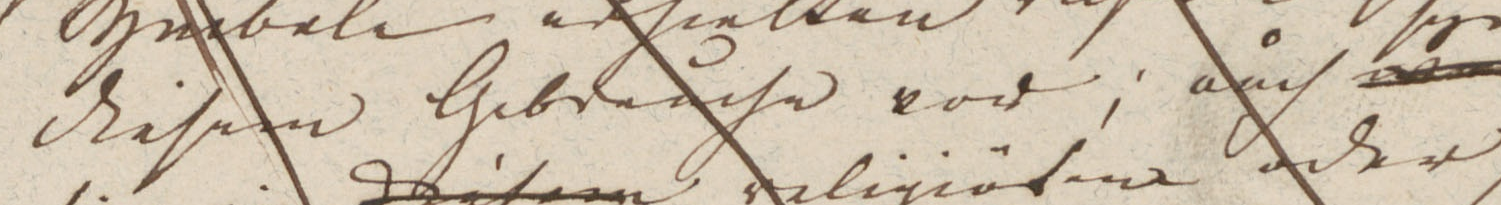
diesem Gebrauche vor; auch waren
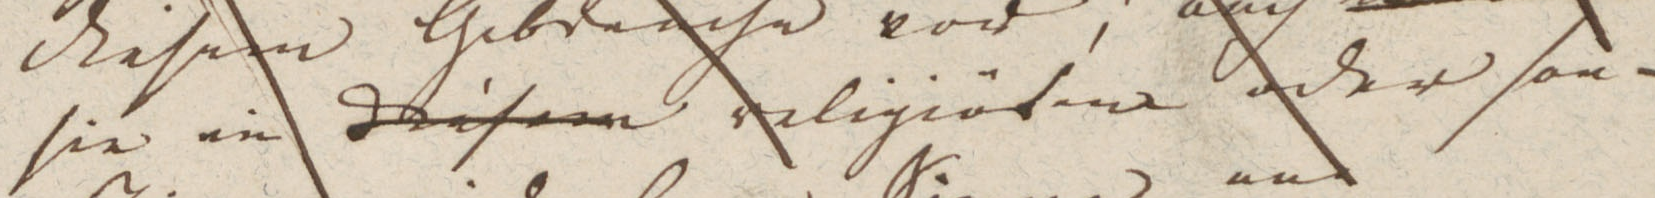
sie in diesem religiösenm oder son-
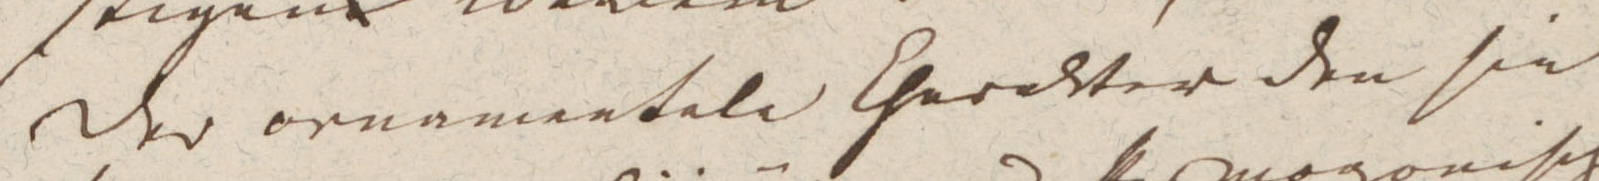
Der ornamentale Charakter den sie
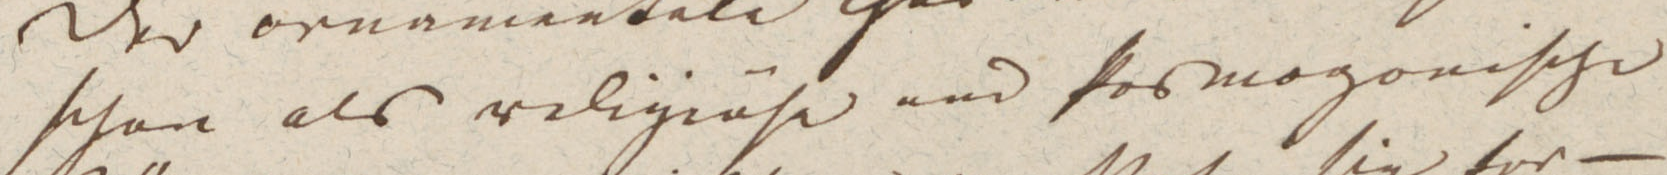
schon als religiöse und kosmogonische
